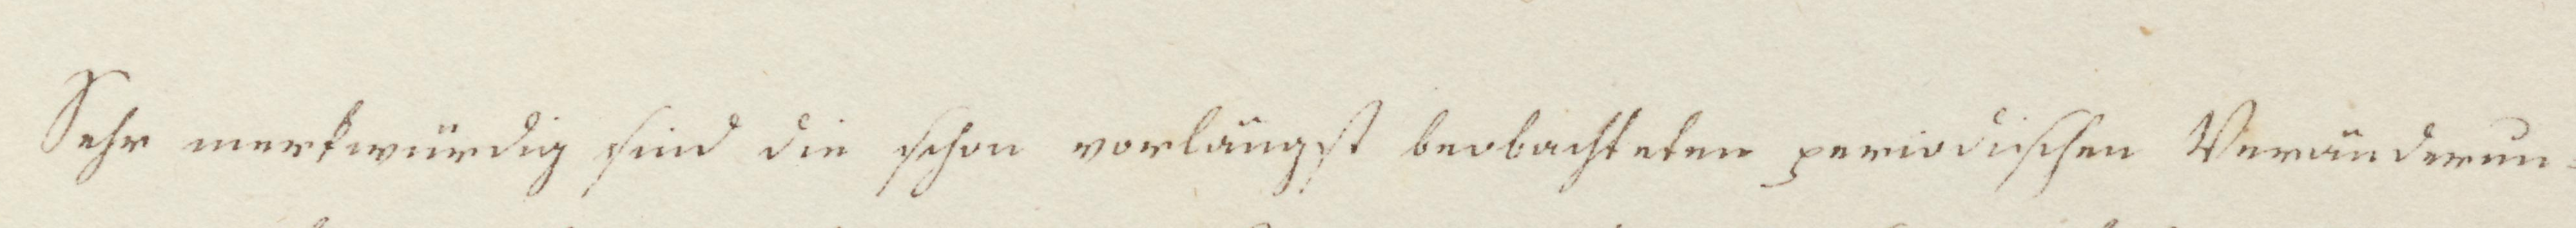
Sehr merkwürdig sind die schon vorlängst beobachteten periodischen Veränderun-
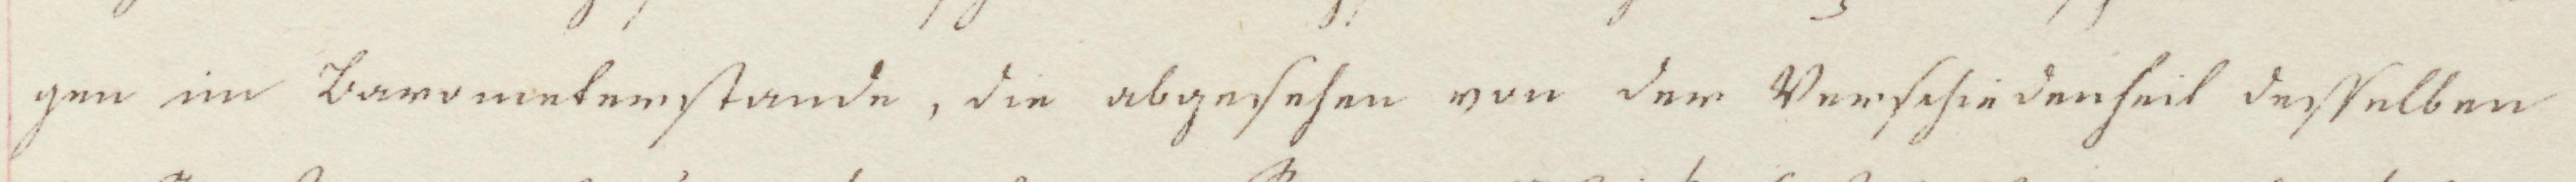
gen im Barometerstande, die abgesehen von der Verschiedenheit desselben
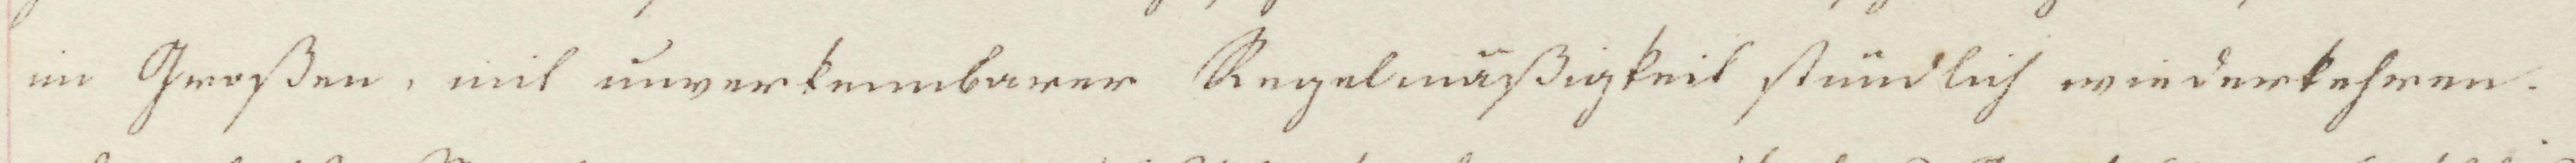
im Großen, mit unverkennbarer Regelmäßigkeit stündlich wiederkehren.
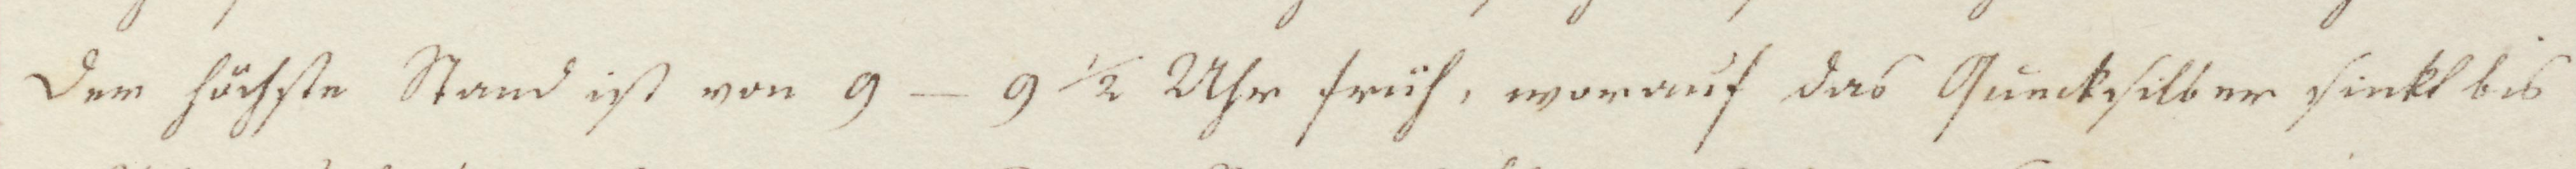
Der höchste Stand ist von 9–9½ Uhr früh, worauf das Quecksilber sinkt bis
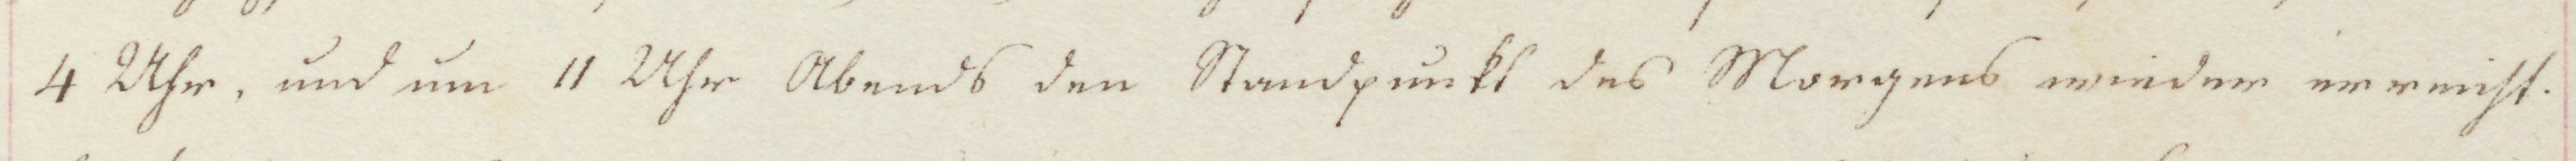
4 Uhr, und um 11 Uhr Abends den Standpunkt des Morgens wieder erreicht.
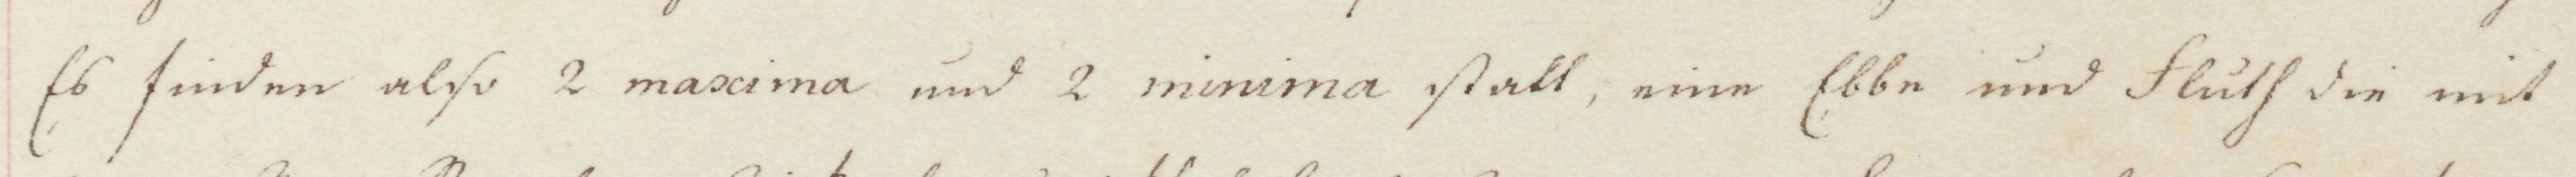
Es finden also 2 maxima und 2 minima statt, eine Ebbe und Fluth die mit
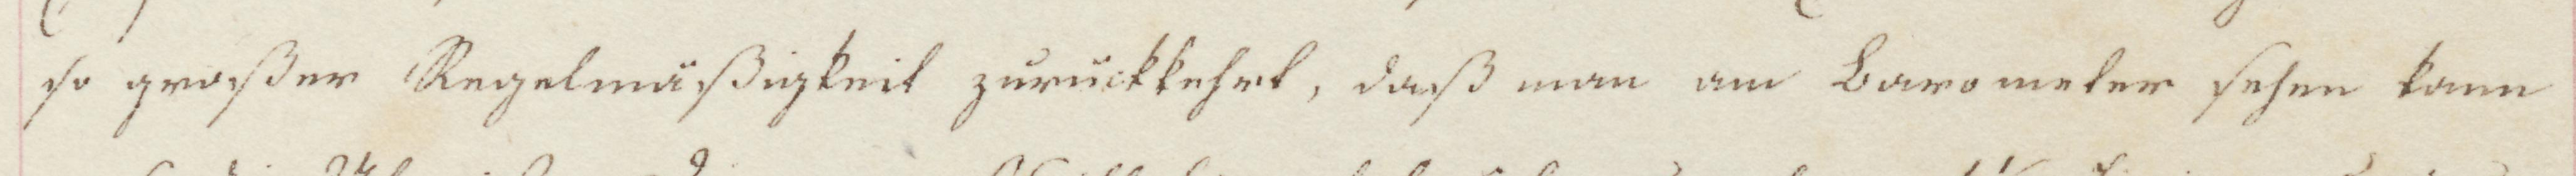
so großer Regelmäßigkeit zurückkehrt, daß man am Barometer sehen kann
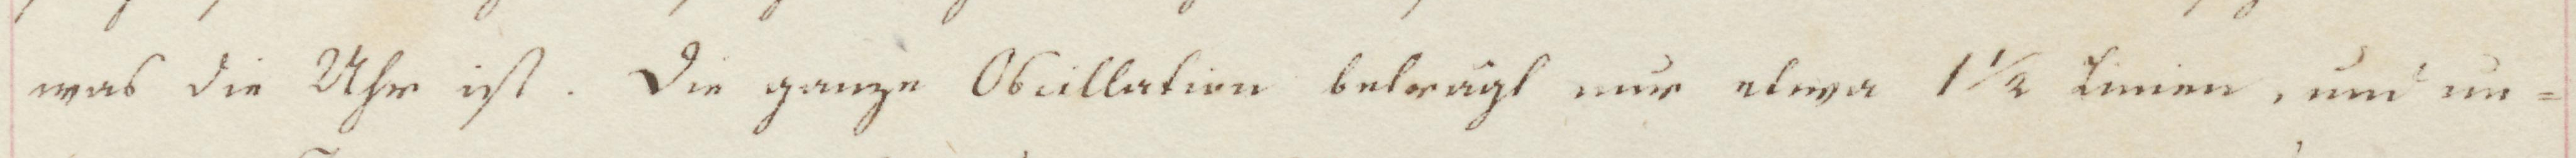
was die Uhr ist. Die ganze Oscillation beträgt nur etwa 1½ Linien, und un-
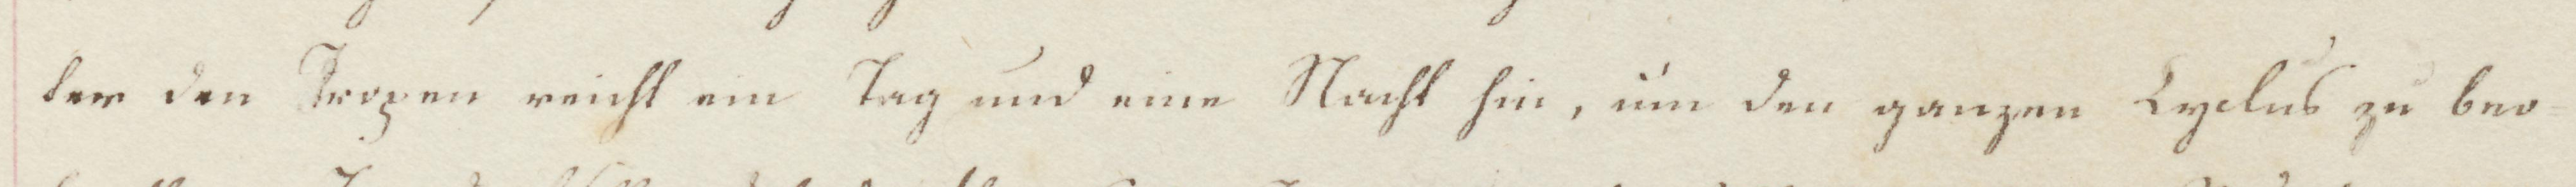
ter den Tropen reicht ein Tag und eine Nacht hin, um den ganzen Cyclus zu beo-
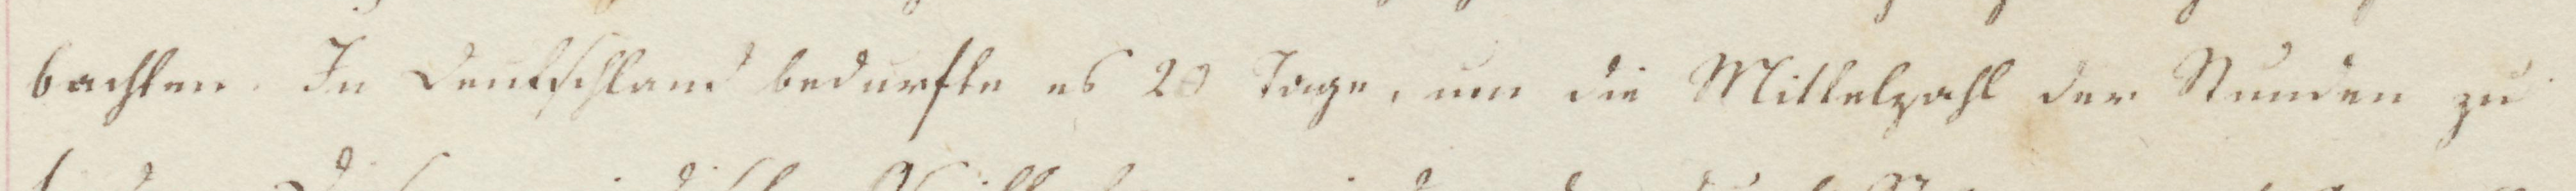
bachten. In Deutschland bedurfte es 20 Tage, um die Mittelzahl der Stunden zu
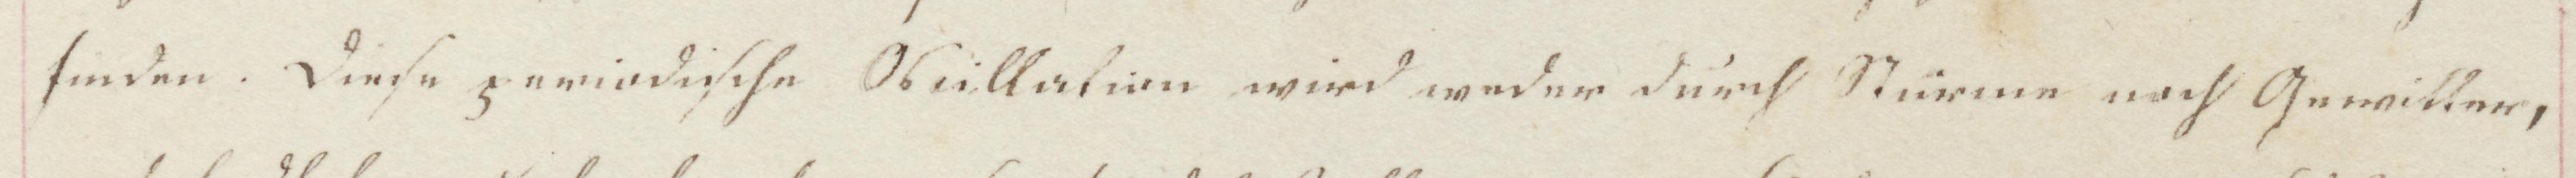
finden. Diese periodische Oscillation wird weder durch Stürme noch Gewitter,
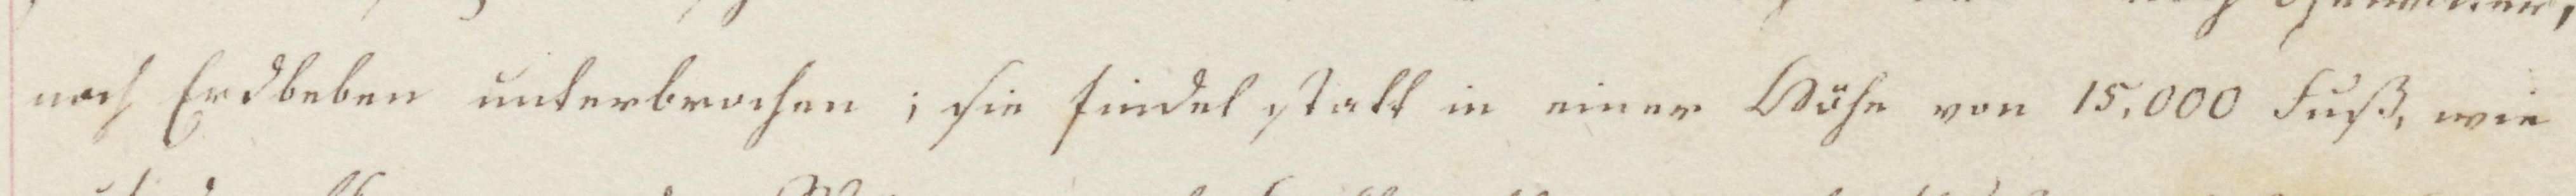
noch Erdbeben unterbrochen; sie findet statt in der Höhe von 15,000 Fuß, wie
